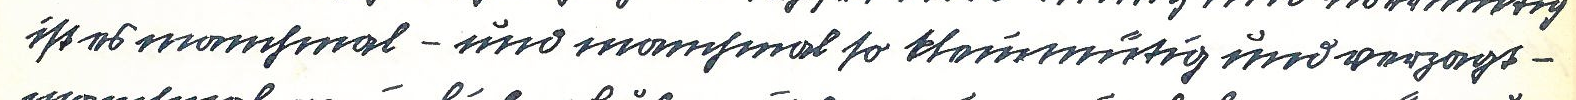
ist es manchmal – und manchmal so kleinmütig und verzagt –
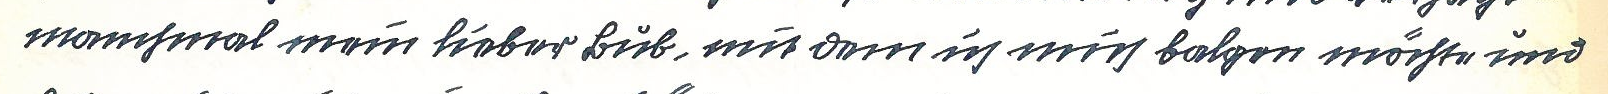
manchmal mein lieber Bub, mit dem ich mich balgen möchte und
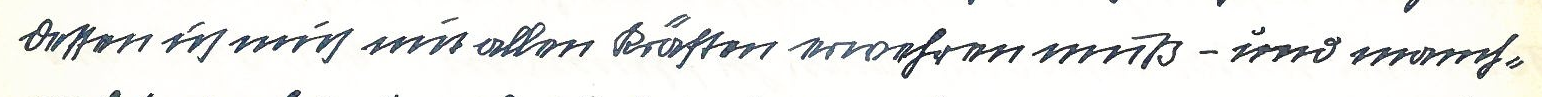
dessen ich mich mit allen Kräften erwehren muß – und manch¬
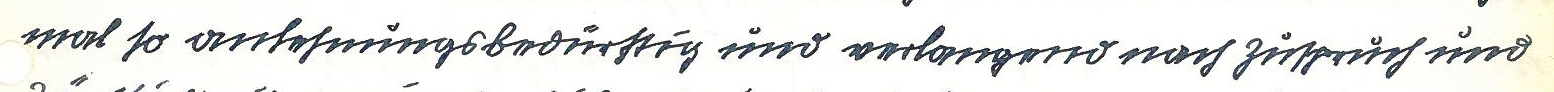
mal so anlehnungsbedürftig und verlangend nach Zuspruch und
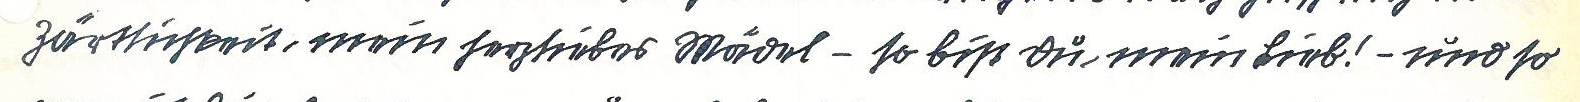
Zärtlichkeit, mein herzliebes Mädel – so bist Du, mein Lieb! – und so
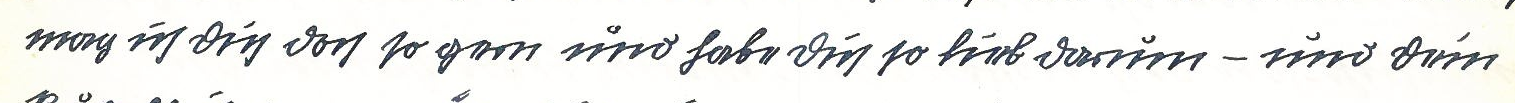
mag ich Dich doch so gern und habe Dich so lieb darum – und Dein
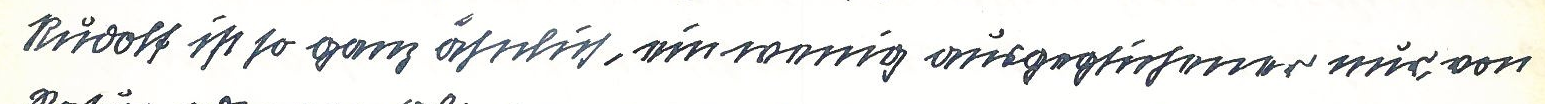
ist so ganz ähnlich, ein wenig ausgeglichener nur, von
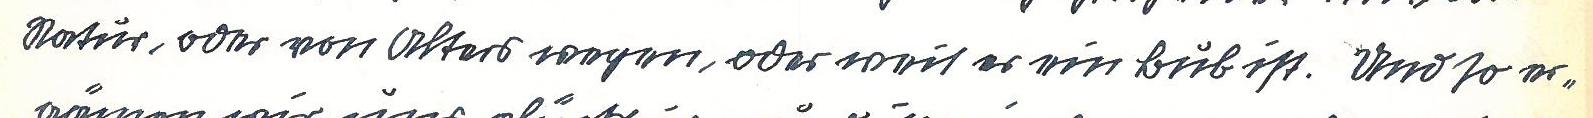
Natur, oder von Alters wegen, oder weil er ein Bub ist. Und so er¬
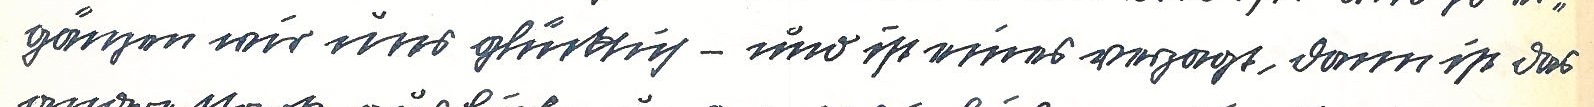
gänzen wir uns glücklich – und ist eines verzagt, dann ist das
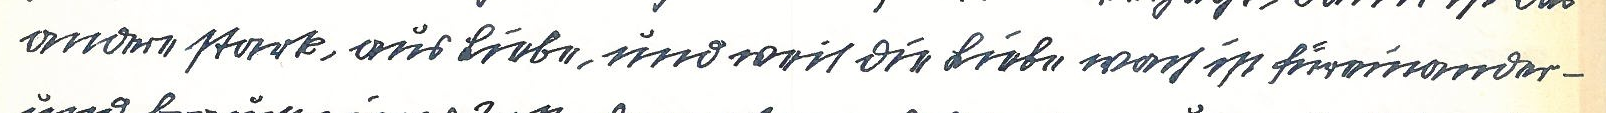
andere stark, aus Liebe, und weil die Liebe wach ist füreinander –
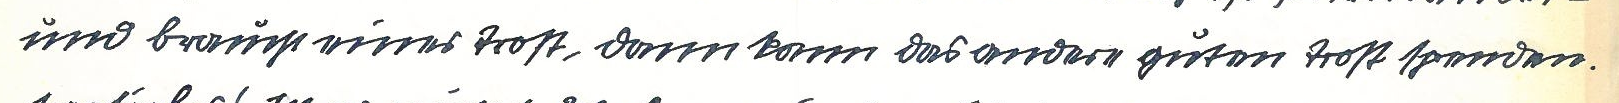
und braucht eines Trost, dann kann das andere guten Trost spenden.
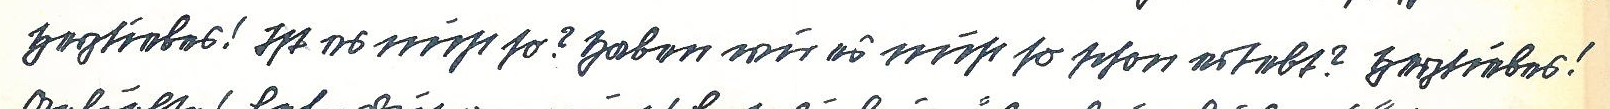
Herzliebes! Ist es nicht so? Haben wir es nicht so schon erlebt? Herzliebes!
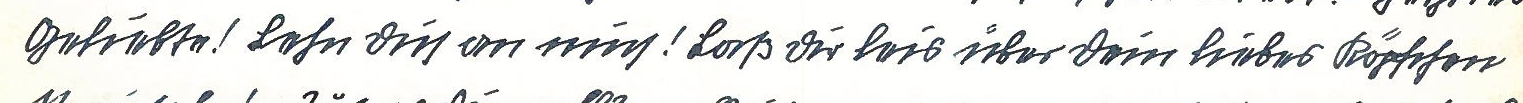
Geliebte! Lehn Dich an mich! Laß Dir leis über Dein liebes Köpfchen
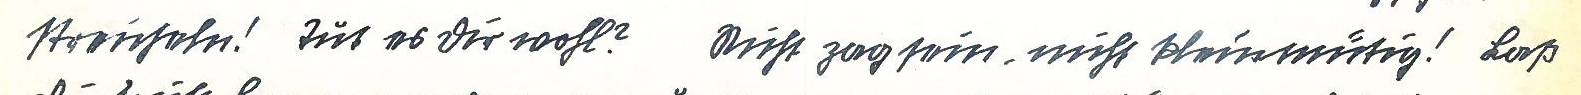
streicheln! Tut es Dir wohl? Nicht zag sein, nicht kleinmütig! Laß
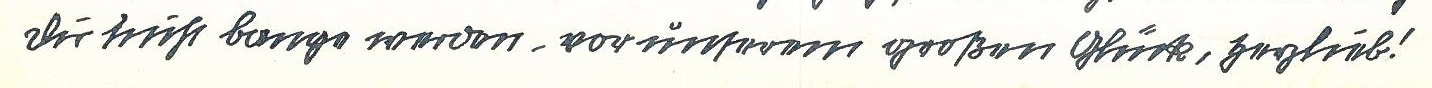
Dir nicht bange werden, vor unserem großen Glück, Herzlieb!
